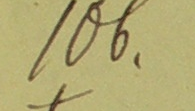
106
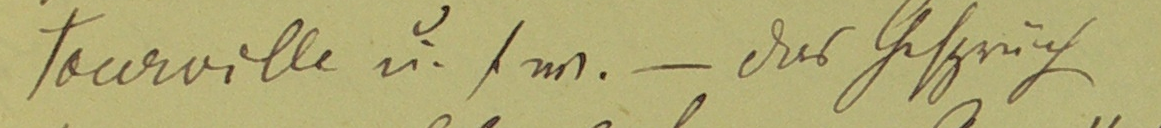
Tourville u.s.w..- Das Gespräch
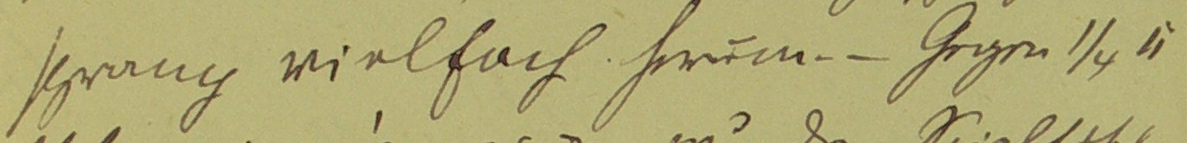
sprang vielfach herum,- Gegen ¼ 11
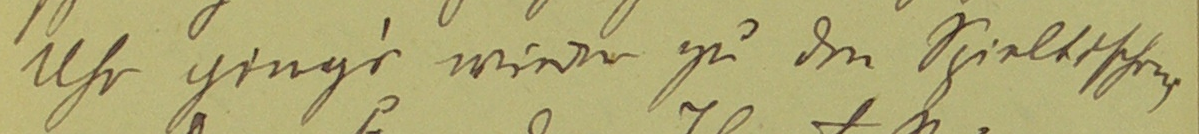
Uhr ging‘s wieder zu den Spieltischen
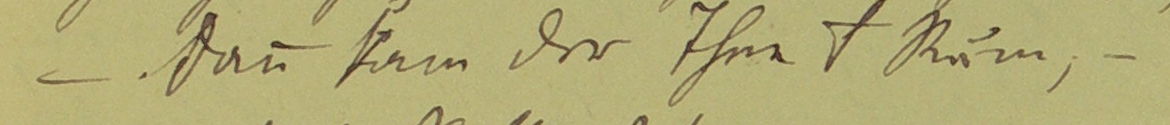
- dann kam der Thee mit Rum;-
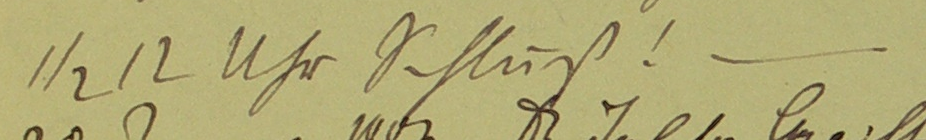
½ 12 Uhr Schluss!-
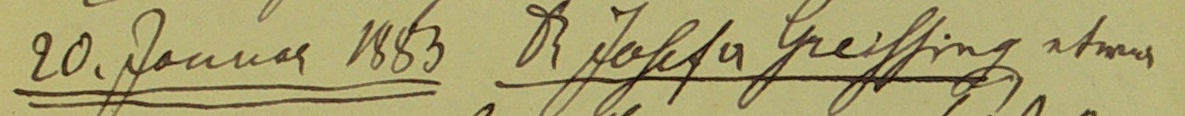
20. Januar 1883. Dr. Josefa Geisting etwa
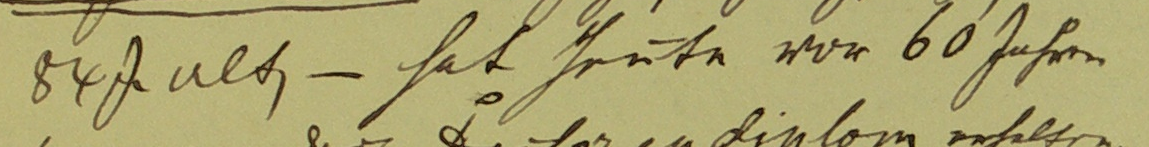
84 Jahre alt - hat heute vor 60 Jahren
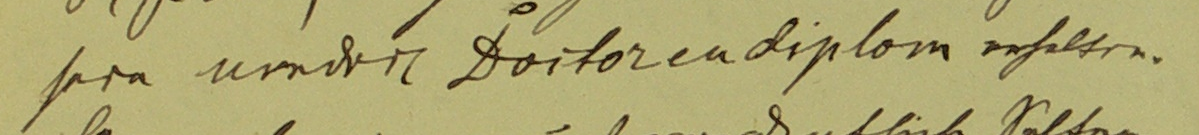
sein ? ?...? Doctorendiplom erhalten.
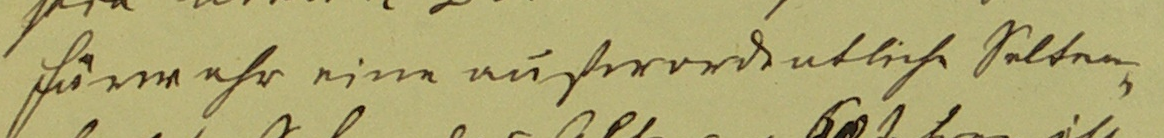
Fürwahr ein außerordentliche Selten¬
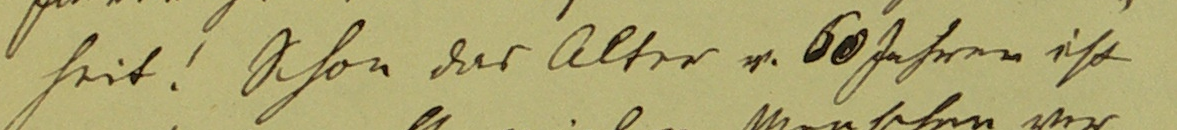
heit! Schon das Alter von 60 Jahren ist
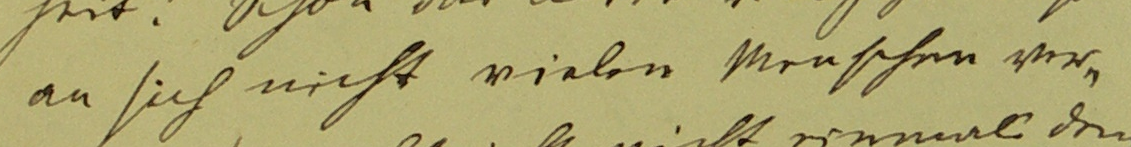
an sich nicht vielen Menschen ver¬
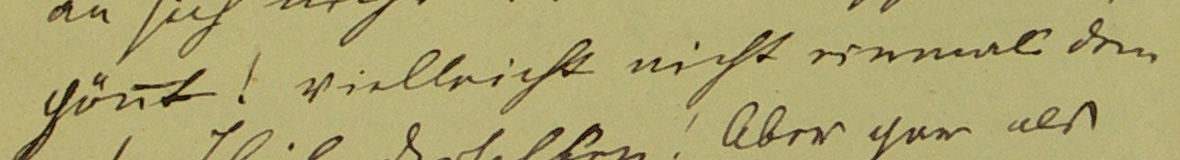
gönnt! Vielleicht nicht einmal den
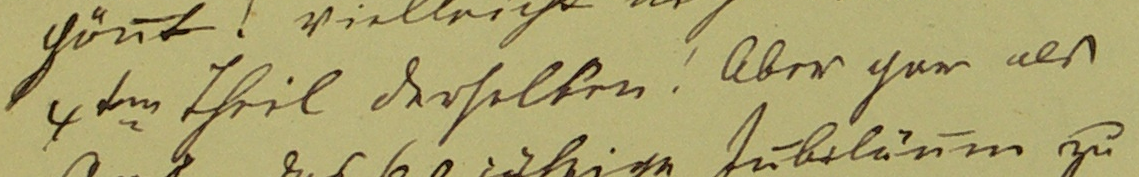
4-ten Theil derselben! Aber gar als
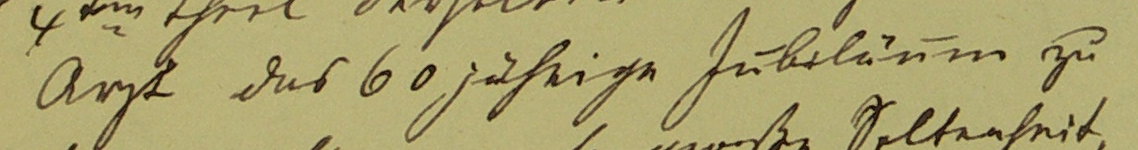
Arzt das 60-jährige Jubiläum zu
